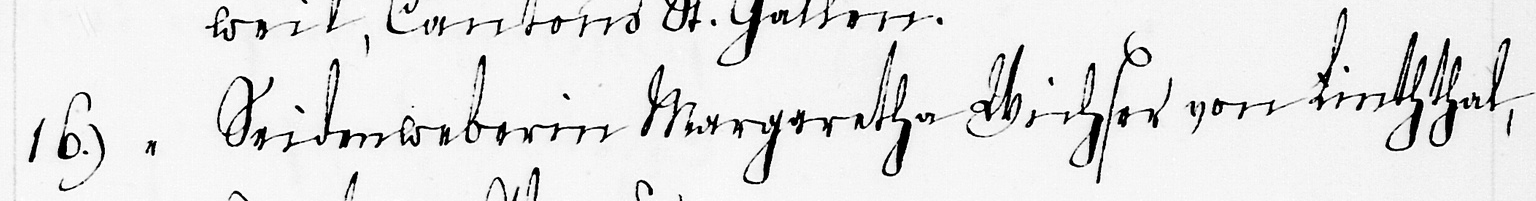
16.) “ Seidenweberin Margaretha Wichser von Linththal,
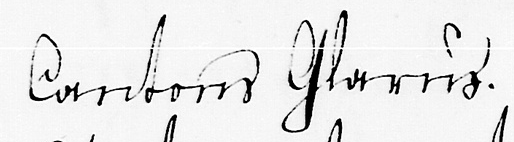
Cantons Glarus.
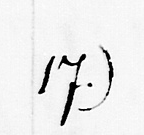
17.)
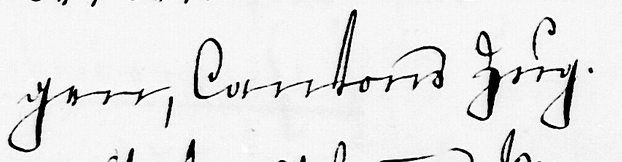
gen, Cantons Zug.
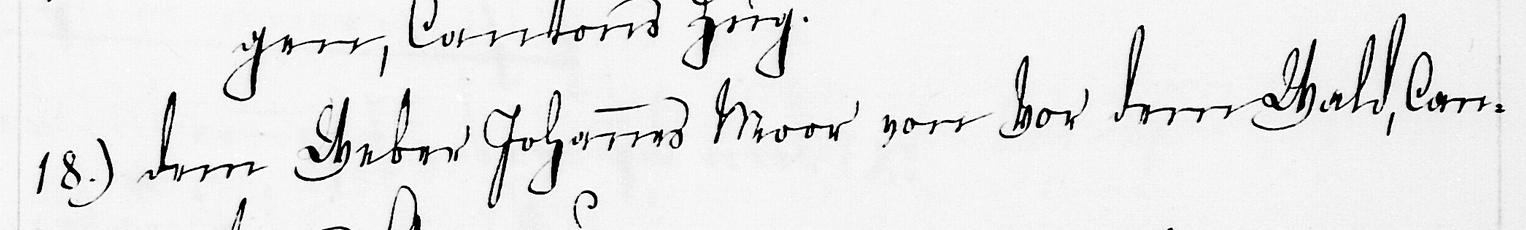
18.) dem Weber Johannes Moor von Vor dem Wald, Can¬
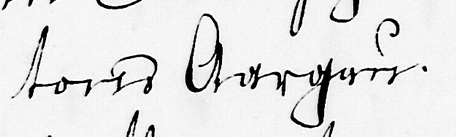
tons Aargau.
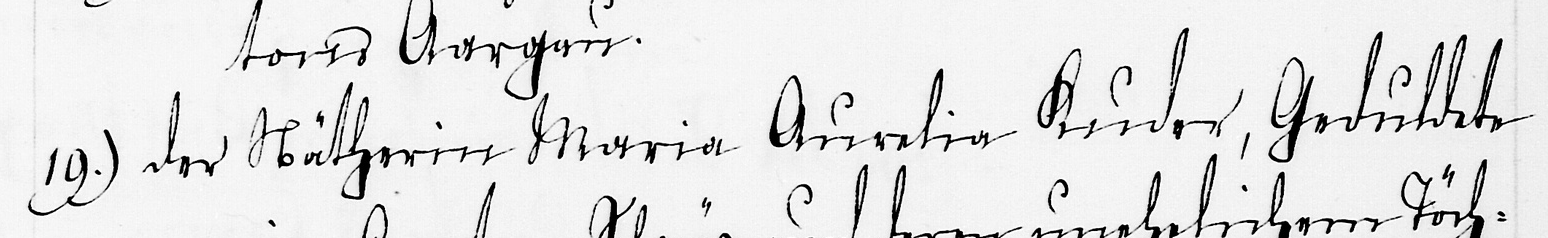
19.) der Nätherin Maria Aurelia Kuder, Geduldete
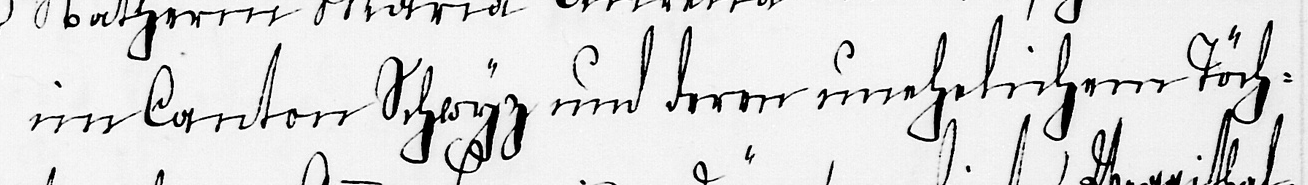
im Canton Schwyz und deren unehelichem Töch¬
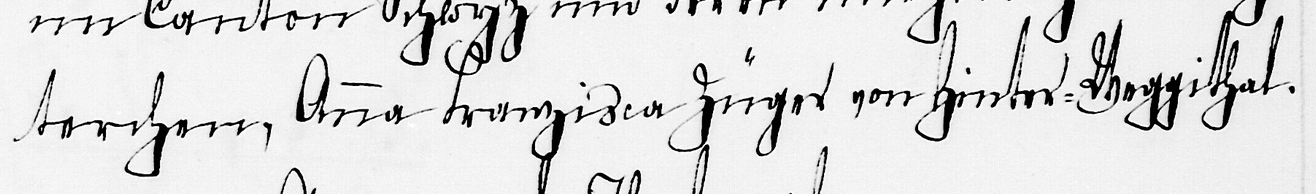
terchen, Anna Franzisca Züger von Hinter-Weggithal.
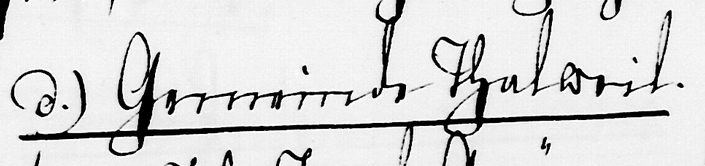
d.) Gemeinde Thalweil.
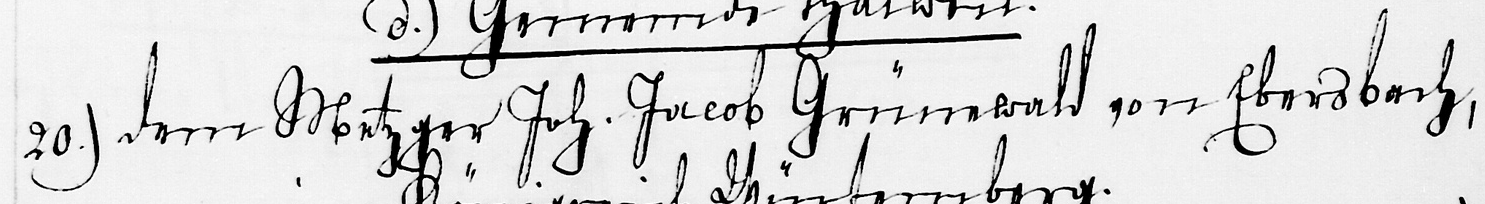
20.) dem Metzger Joh. Jacob Grünewald von Ebersbach,
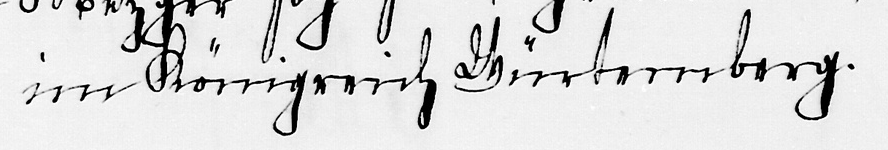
im Königreich Würtemberg.
